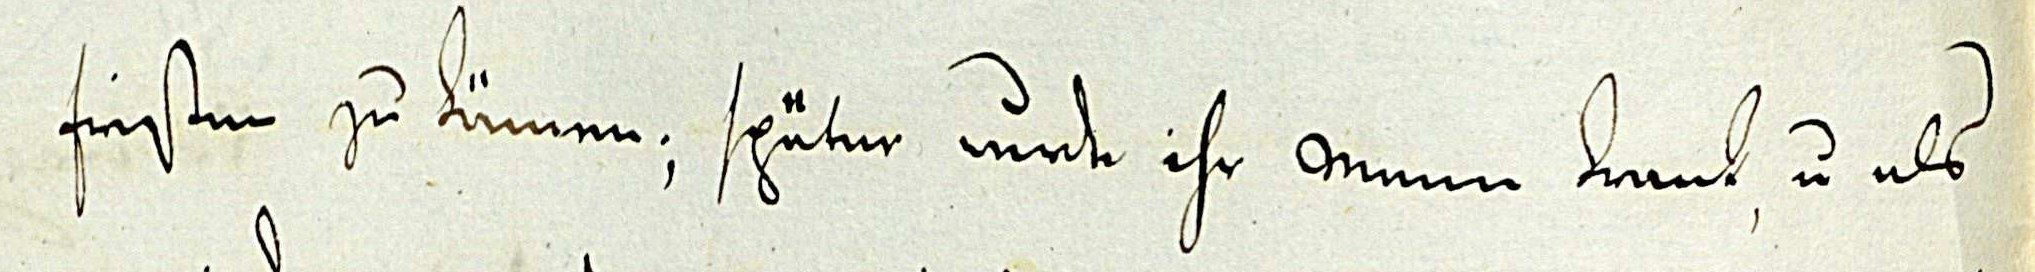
fristen zu können; später wurde ihr Mann krank u als
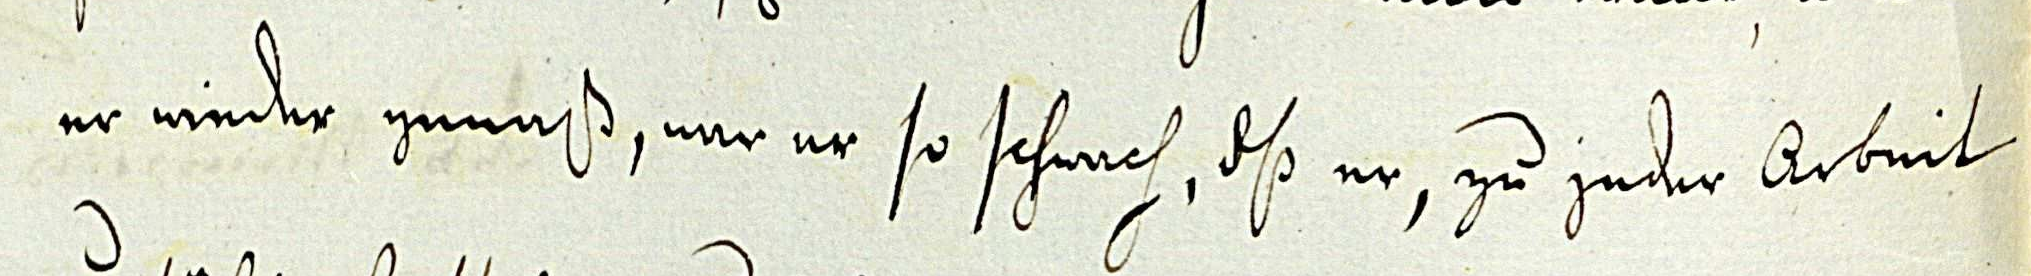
er wieder genaß, war er so schwach, daß er, zu jeder Arbeit
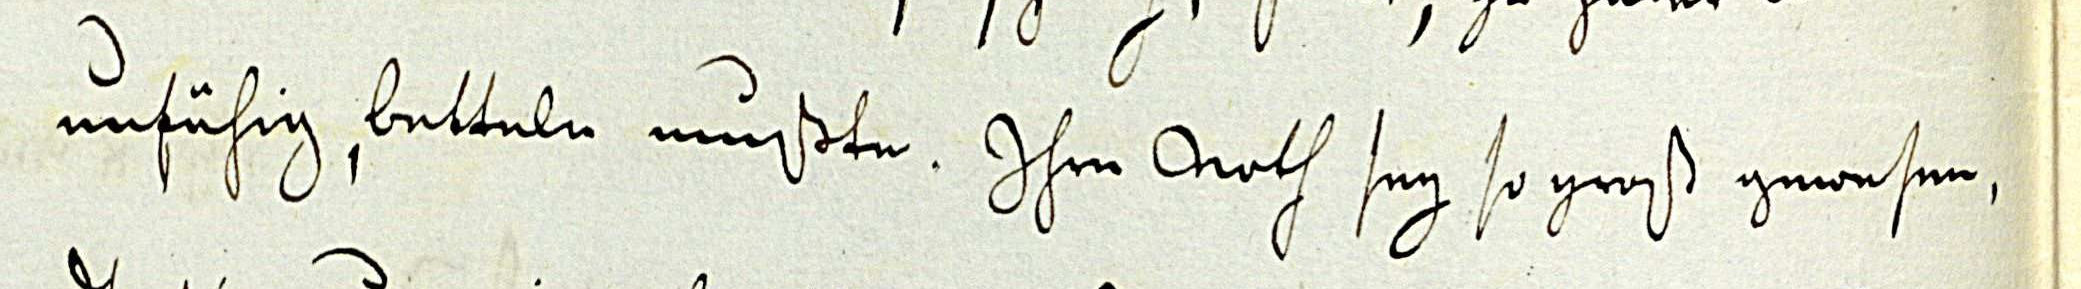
unfähig, betteln mußte. Ihre Noth sey so groß gewesen,
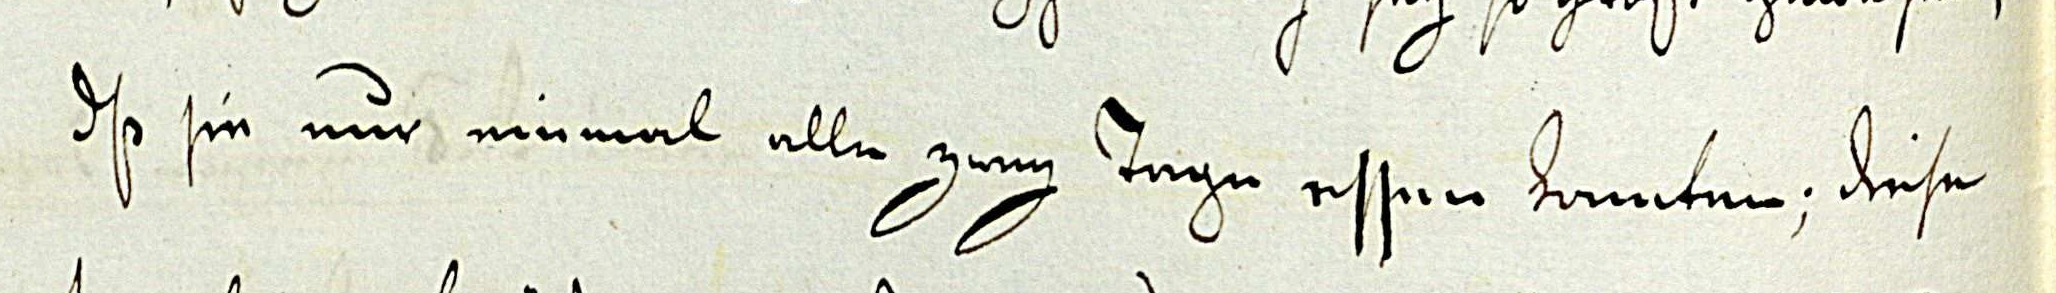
daß sie nur einmal alle zwey Tage essen konnten; diese
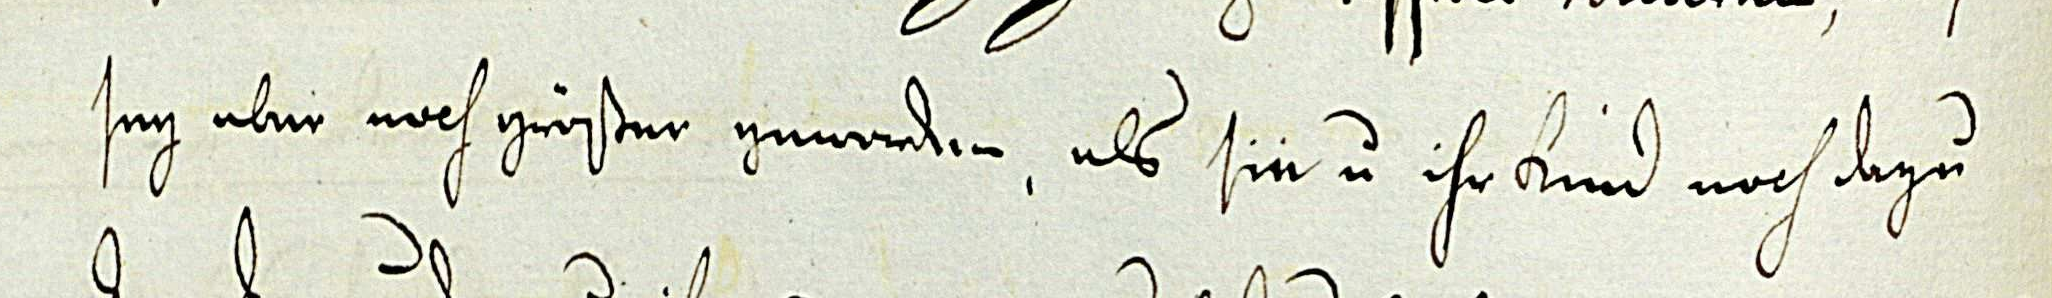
sey aber noch größer geworden, als sie u. ihr Kind noch dazu
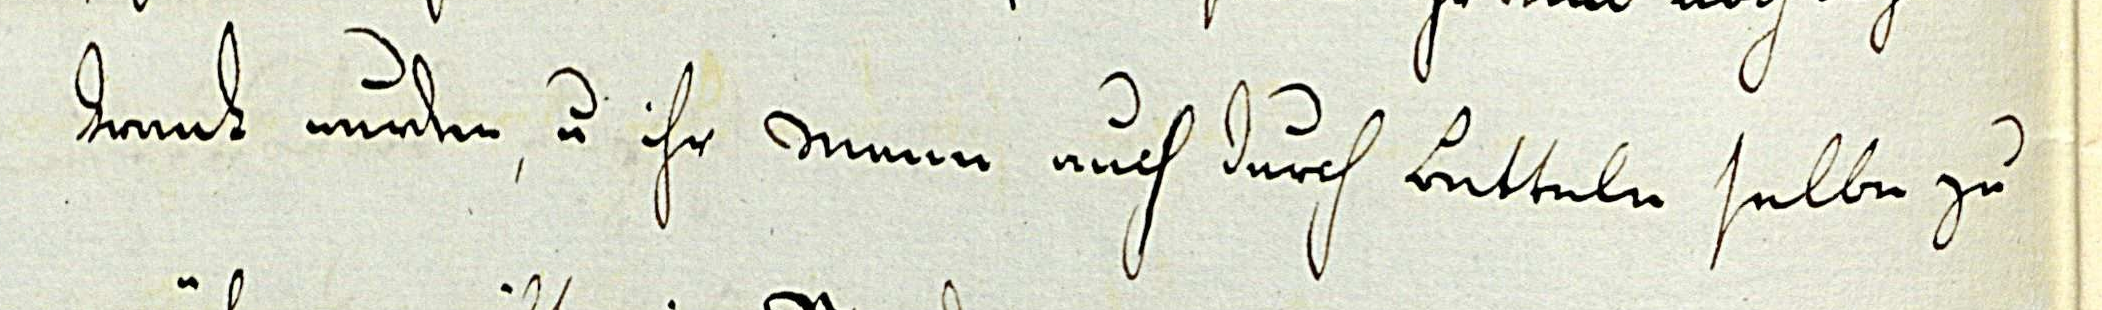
krank wurden, u ihr Mann auch durch Betteln selbe zu
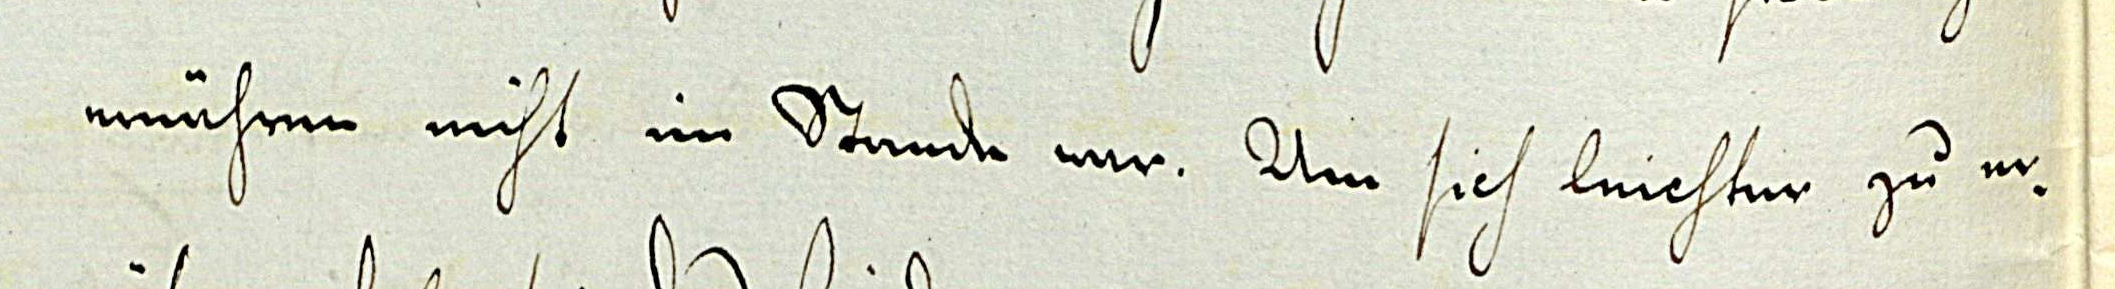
ernähren nicht im Stande war. Um sich leichter zu er¬
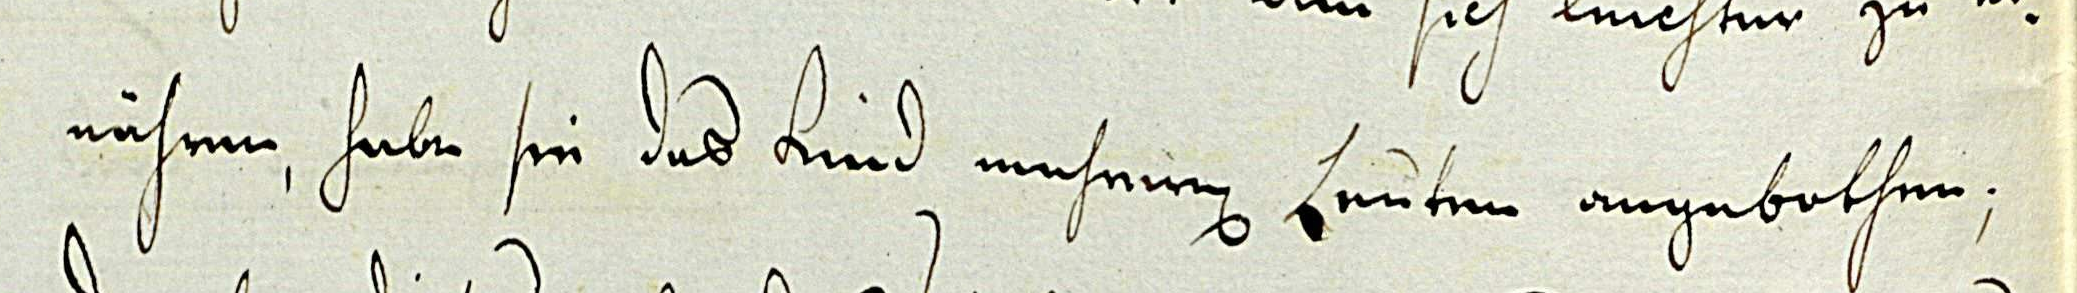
nähren, habe sie das Kind mehrere Leuten angebothen;
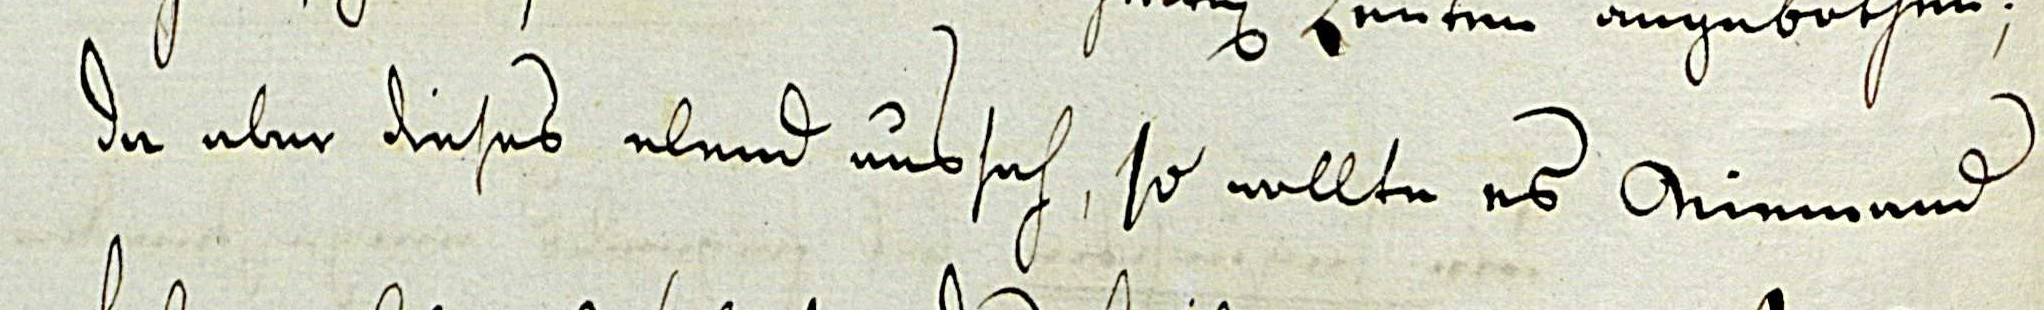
da aber dieses elend aussah, so wollte es Niemand
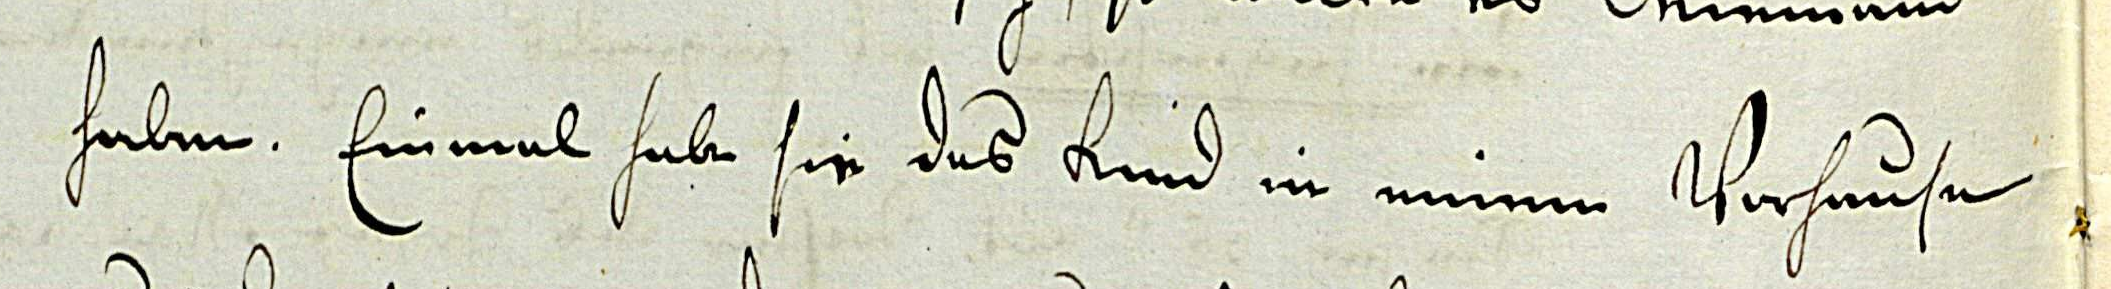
haben. Einmal habe sie das Kind in einem Vorhause
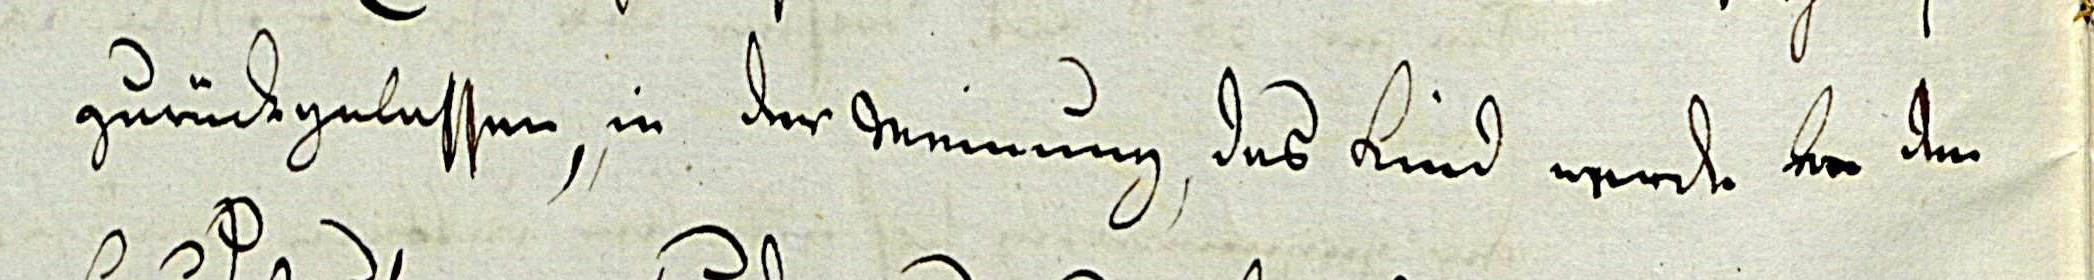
zurückgelassen, in der Meinung, das Kind wurde von den
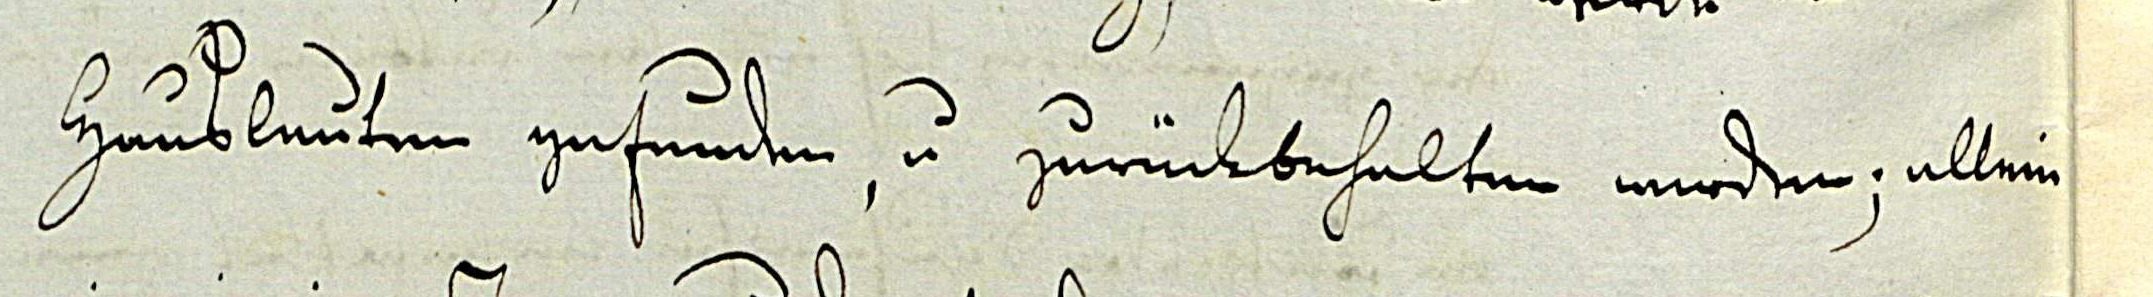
Hausleuten gefunden, u zurückbehalten werden; allein
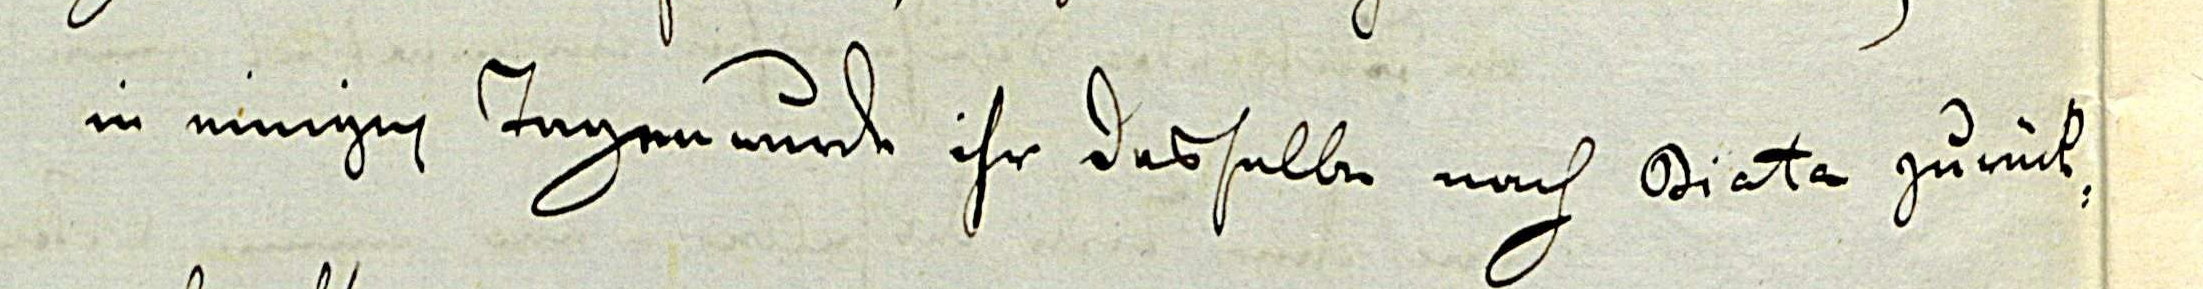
in einige Tagen wurde ihr dasselbe noch Biała zurück¬
